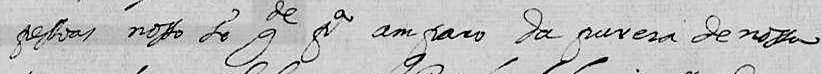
pessoas nosso sr̄ gde pa amparo da pureza de nossa
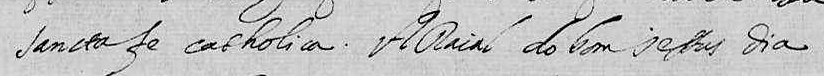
sancta fe catholica. ARaial do bom jessus dia
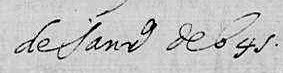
de Janro de 645.
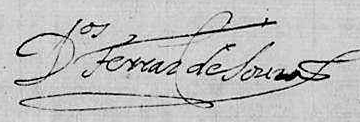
Dos Ferraz de Souza
